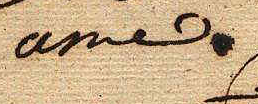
anno.
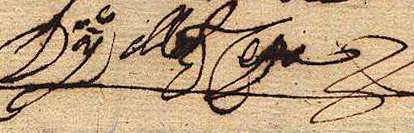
Dȳo Mr̄z Cepa
